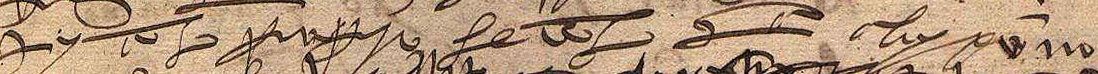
tey cō ho proprjo he c̄o ho tā abayxo no
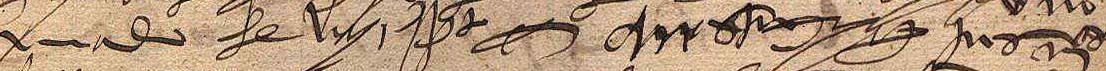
meado he vay espto Em duastr dygo tres mas
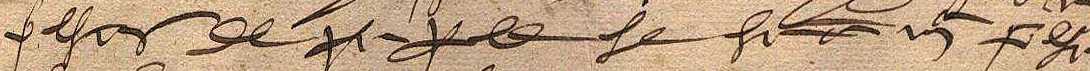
folhas de papell he huā ma folha
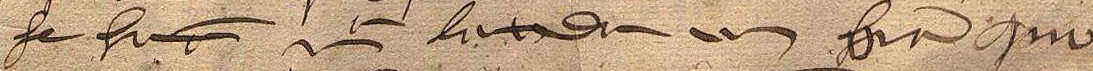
he huā ma lauda em brāquo
